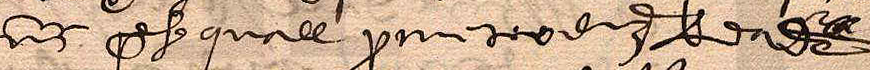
mte p̄o ho quall ꝓmeteo diz̄ ꝟdade
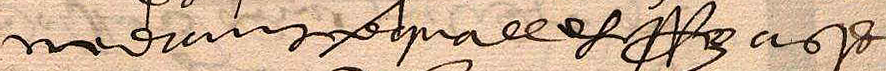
mediante o quall lhe ffez as p̄
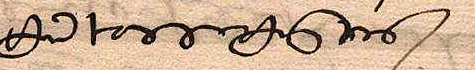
gūtas seguītes /
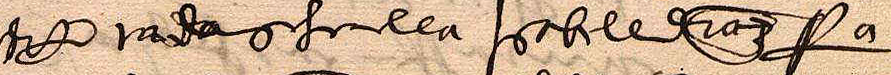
p̄gūtada se he ella Jsabell diaz fa
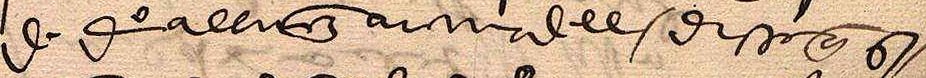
de do alluēz armadell / disse q̄ sj /
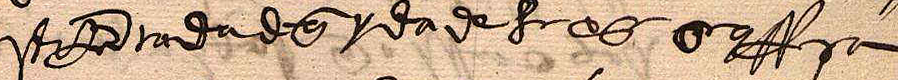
p̄gūtada de q̄ ydade he e se se ꝯffesa
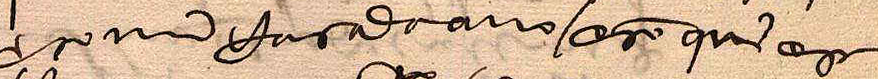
e comūga cada ano / e c̄o quē e se
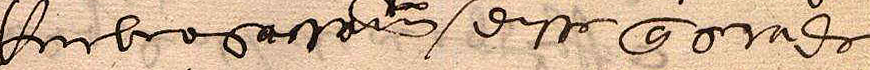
Recebe o sacramto / disse q̄ sera de
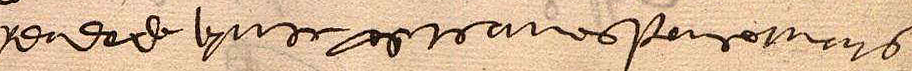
ydade de vynte e seis anos pouco mais
